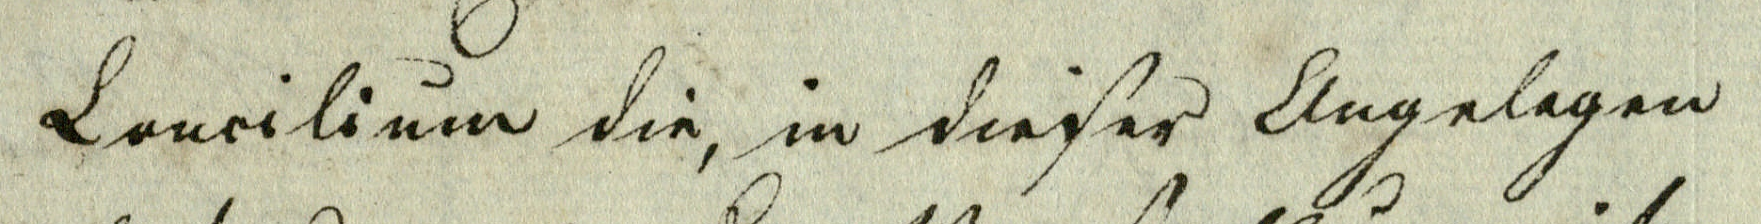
Concilium die, in dieser Angelegen¬
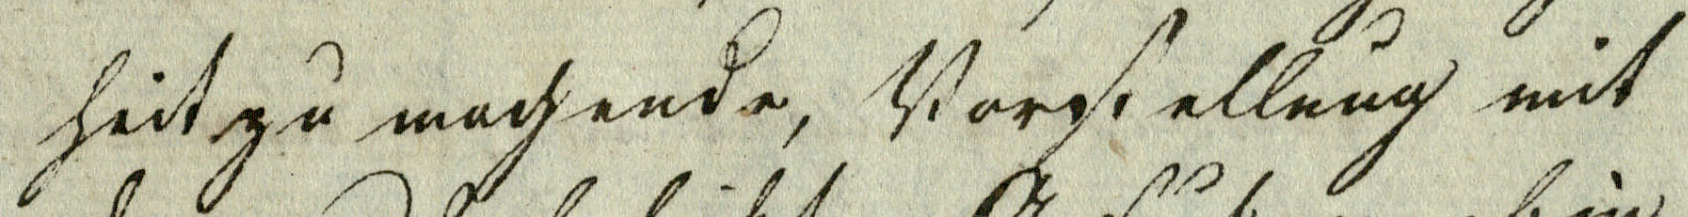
heit zu machende Vorstellung mit
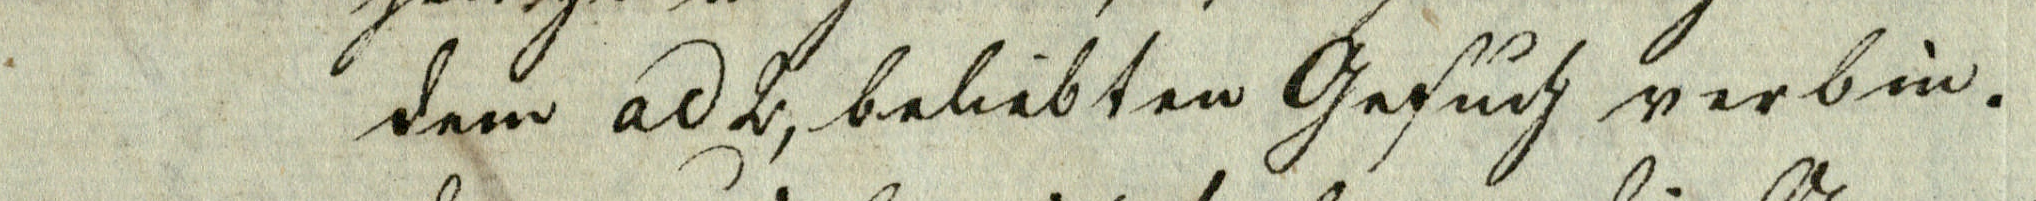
dem ad 2, beliebten Gesuch verbin¬
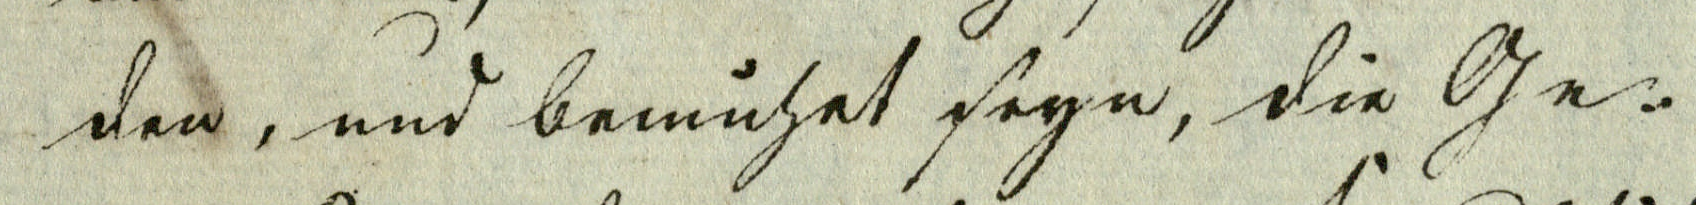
den, und bemühet seyn, die Ge¬
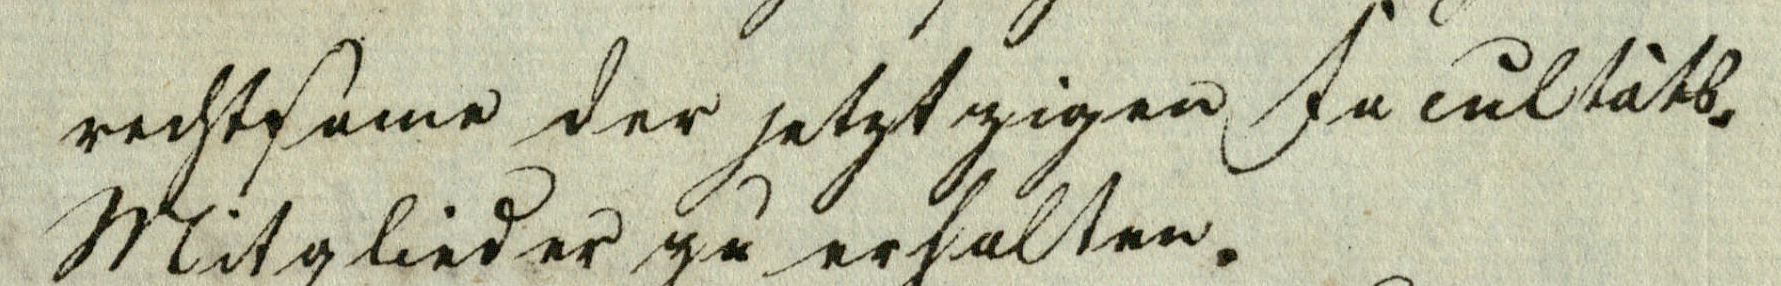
rechtsame der jetzigen Facultäts¬
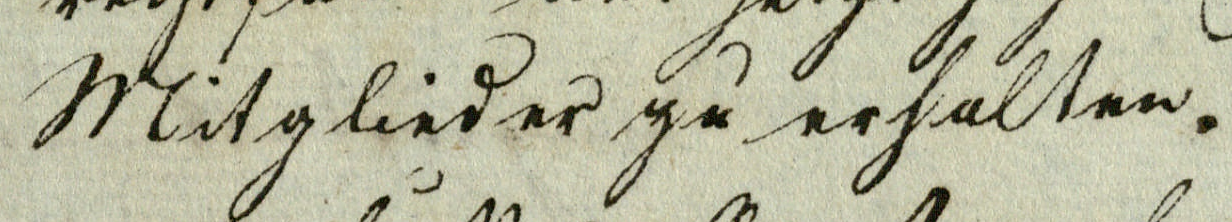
Mitglieder zu erhalten.
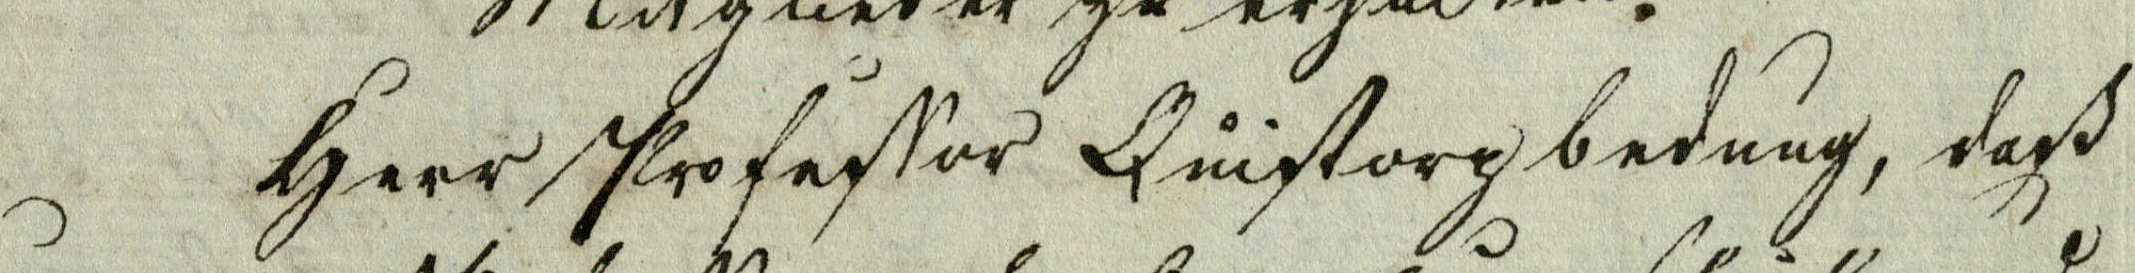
Herr Professor Quistorp bedung, daß
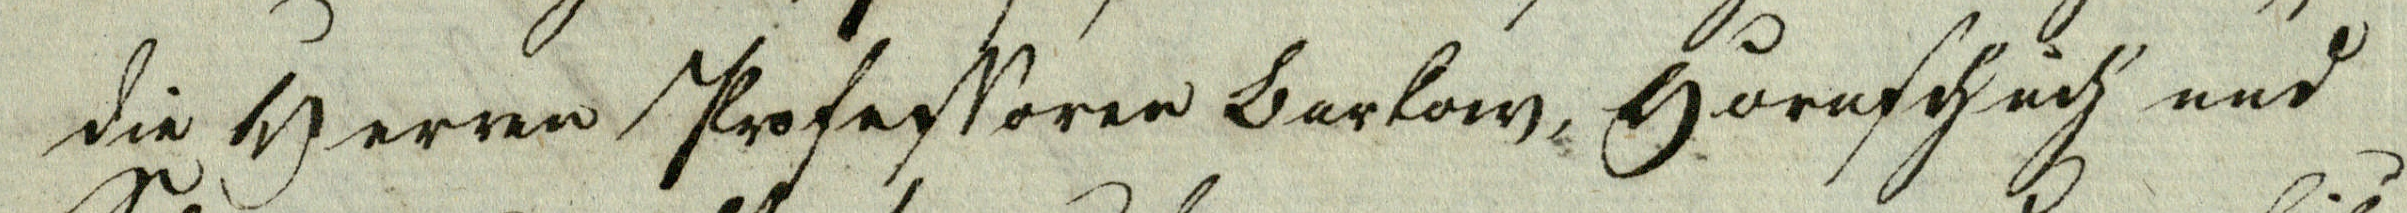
die Herren Professoren Barkow, Hornschuch und
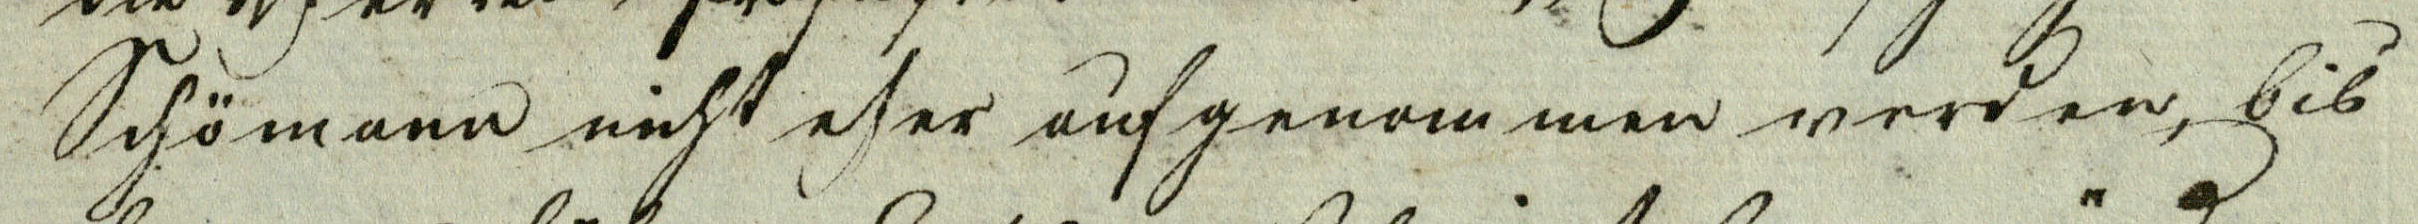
Schömann nicht eher aufgenommen werden, bis
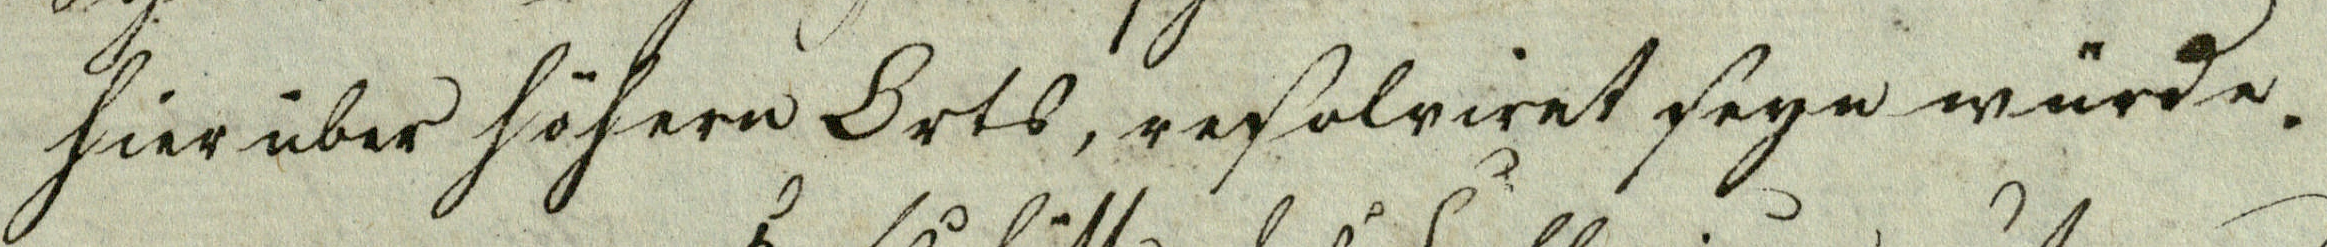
hierüber höhern Orts, resolviret seyn würde.
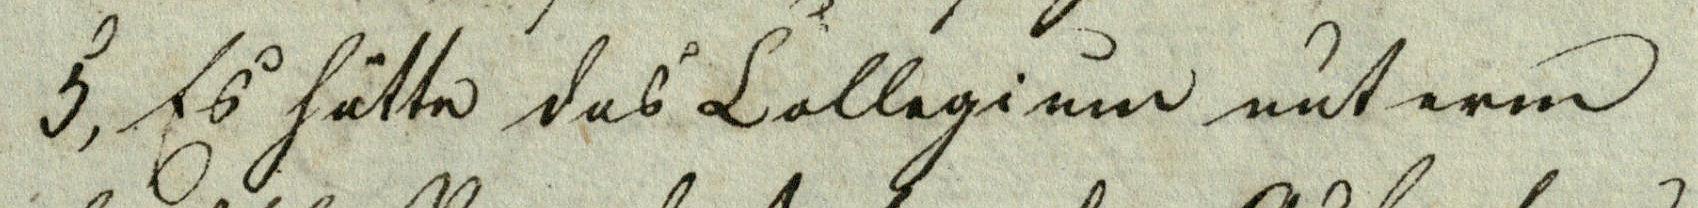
5, Es hätte das Collegium unterm
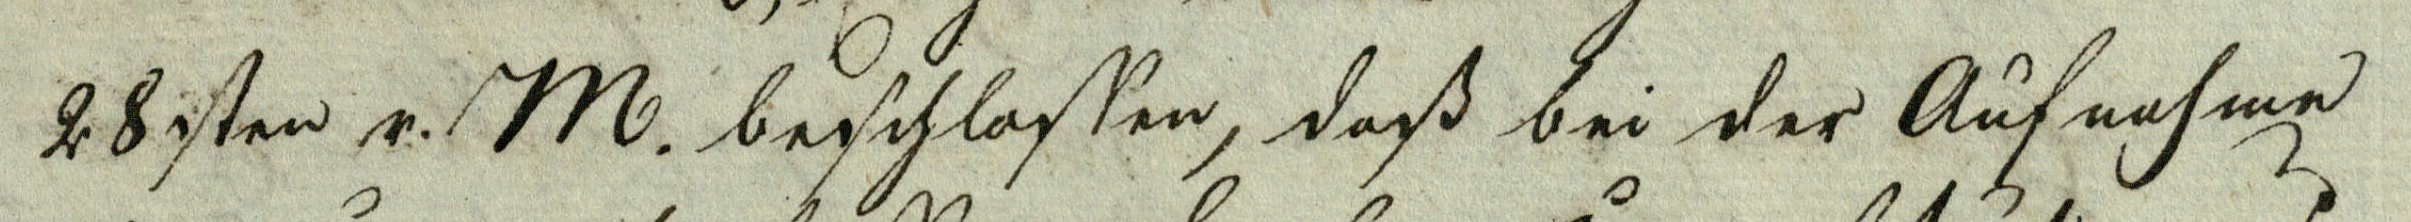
28ten v. M. beschlossen, daß bei der Aufnahme
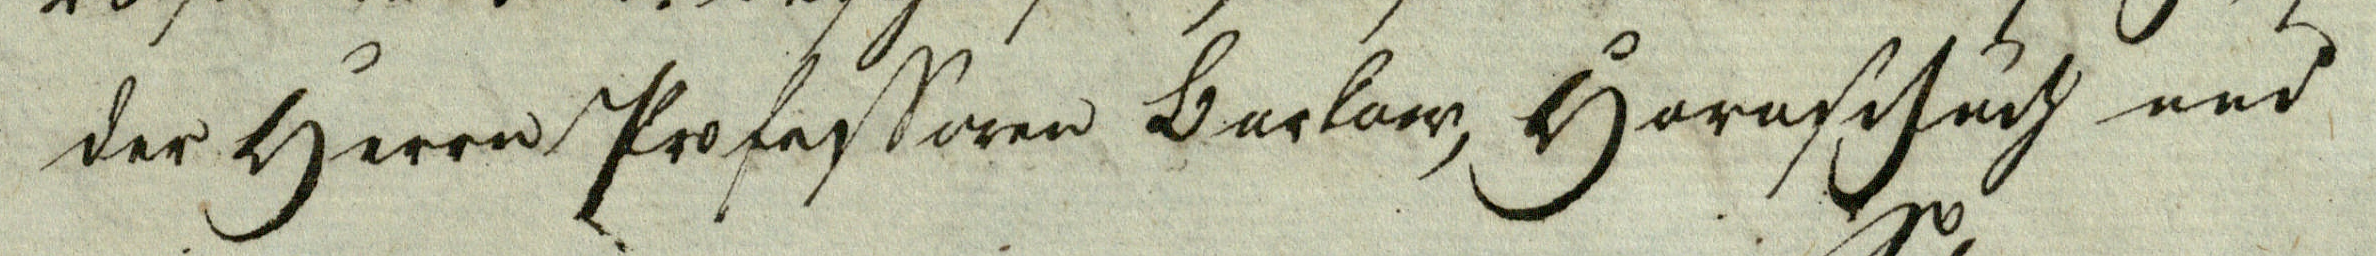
der Herrn Professoren Barkow, Hornschuch und
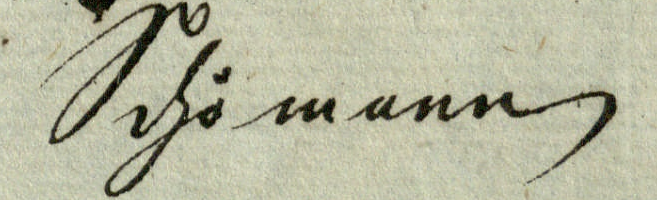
Schömann
